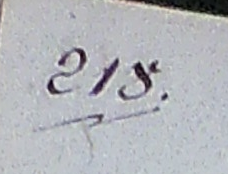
218.
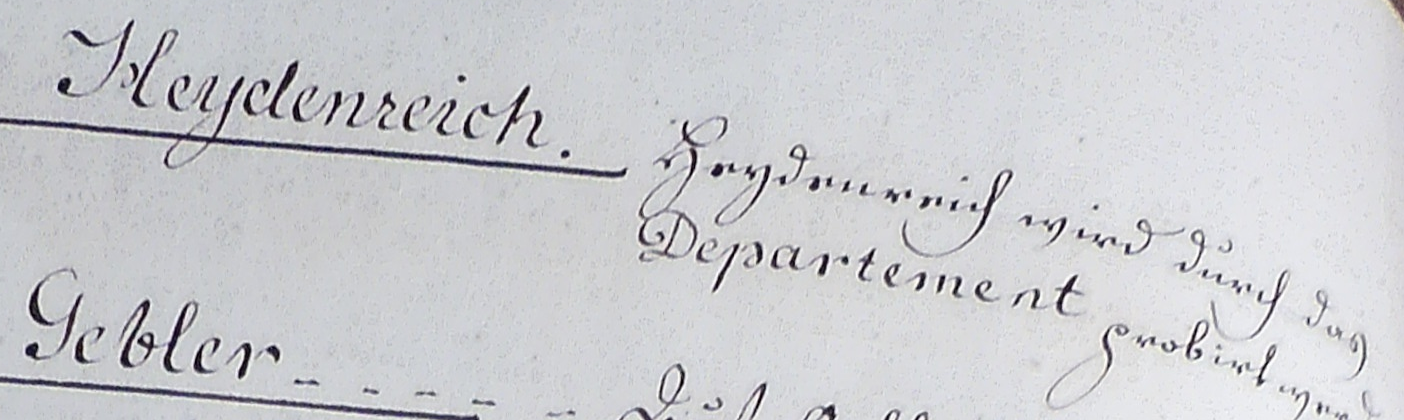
Heydenreich. Heydenreich wird durch das
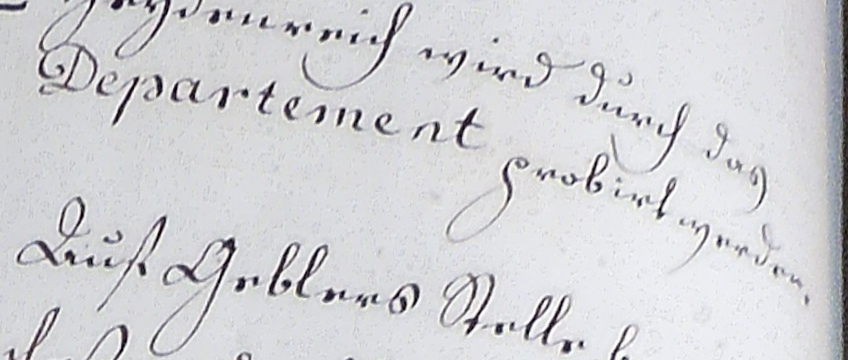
Departement probirt werden.
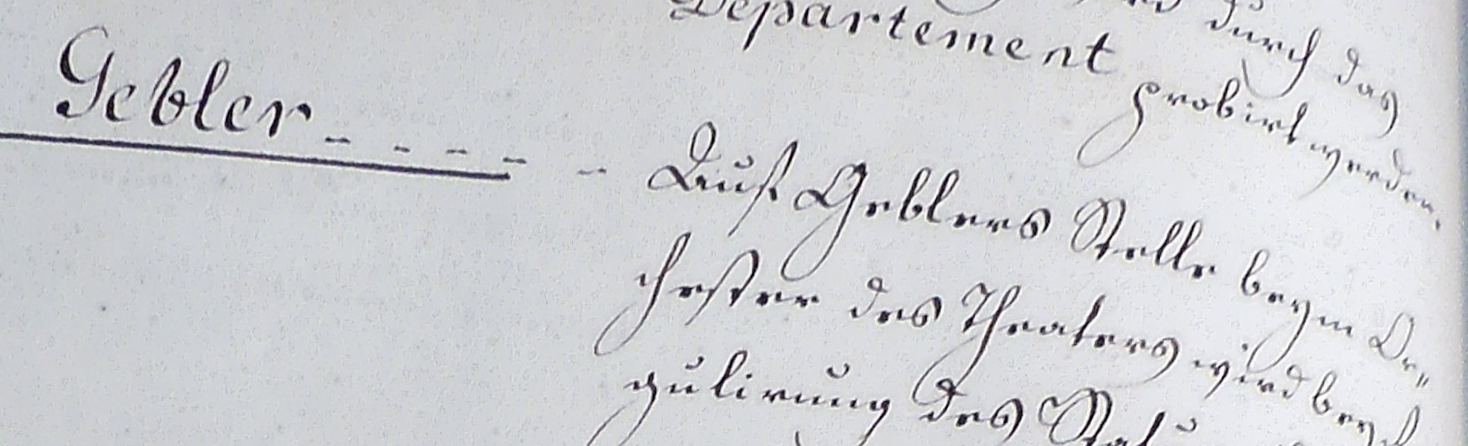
Gebler .. .. .. .. .. Auf Geblers Stelle beym Or¬
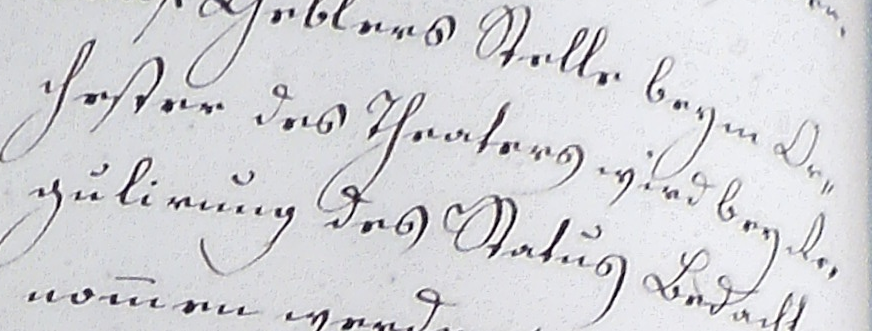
chester des Theaters wird bey Re¬
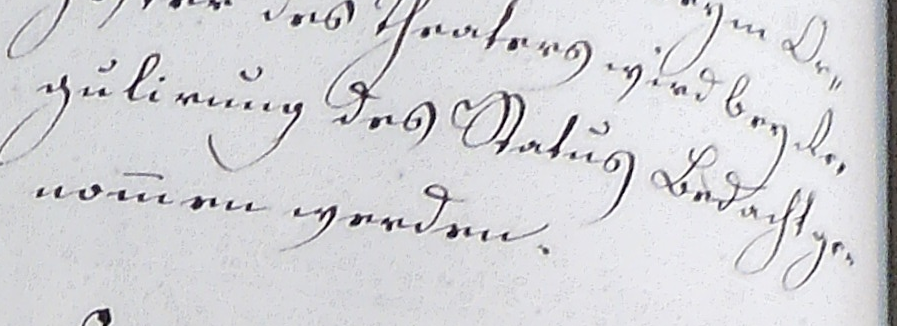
gulirung des Status, Bedacht ge¬
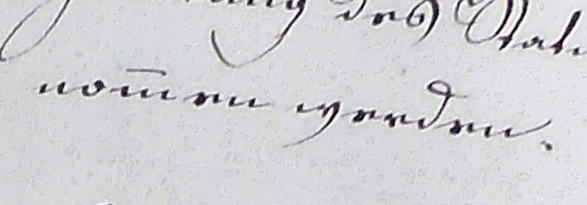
nom̅en werden.
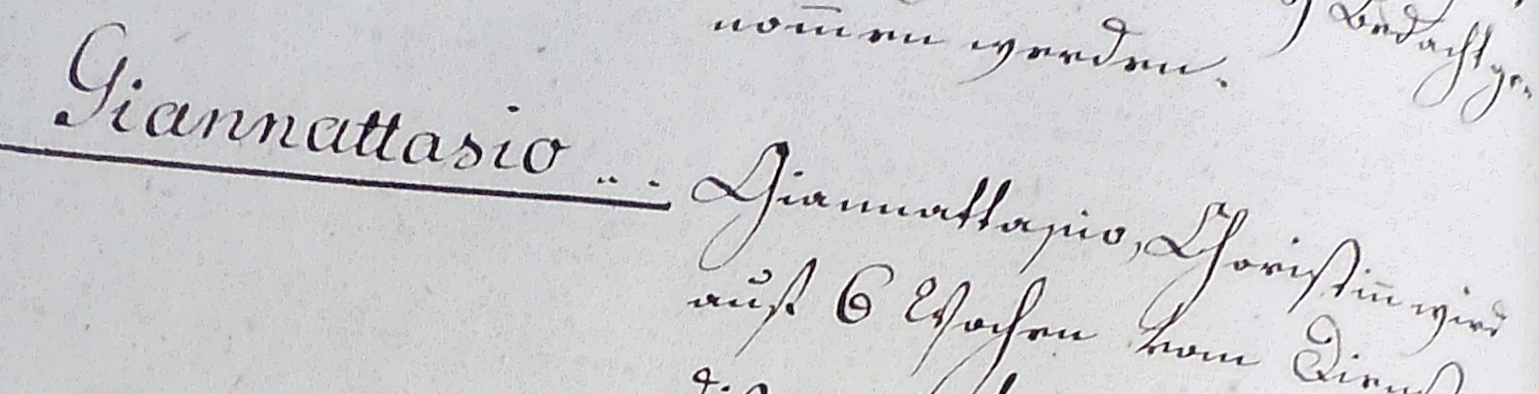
Giannattasio .. . Giannattasio, Choristin wird
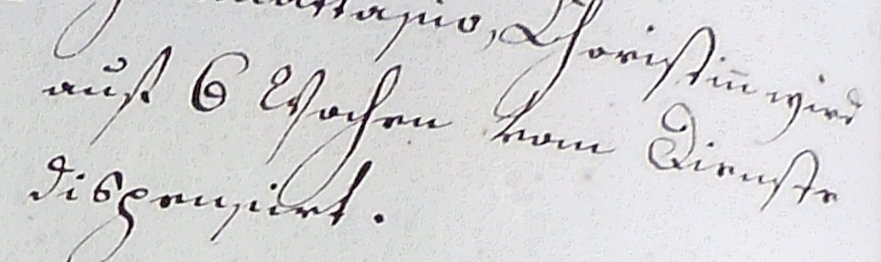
auf 6 Wochen vom Dienste
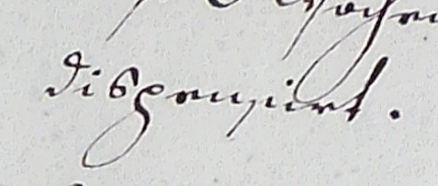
dispensirt.
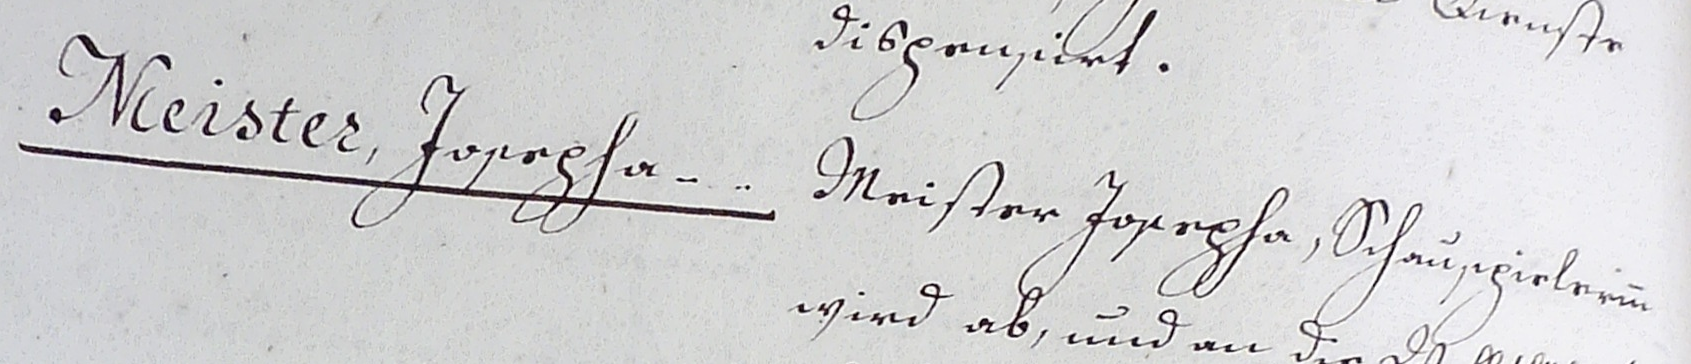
Meister, Josepha .. .. Meister Josepha, Schauspielerin̅
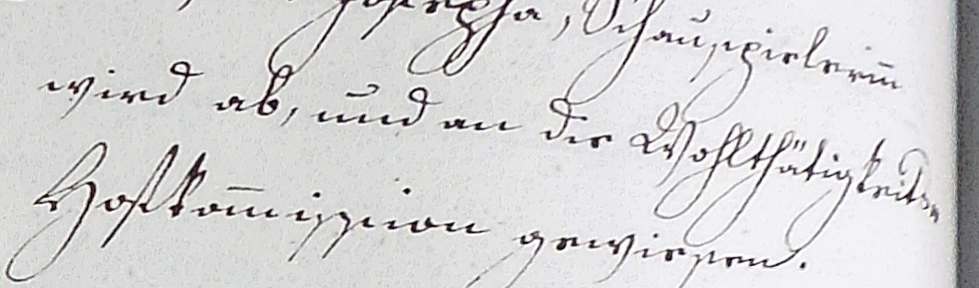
wird ab, und an die Wohlthätigkeiten
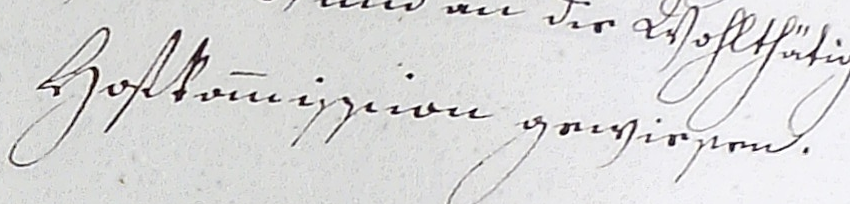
Hofkom̅ission gewiesen.
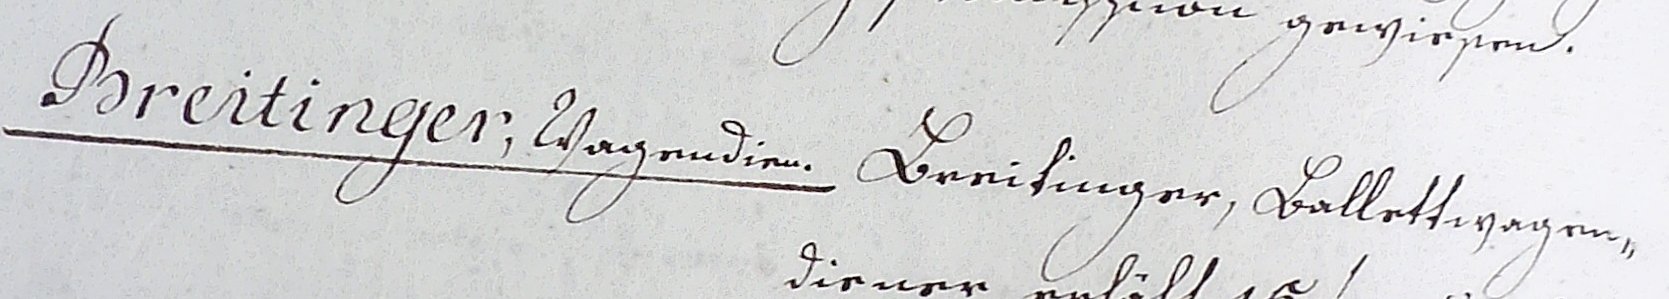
Breitinger, Wagendien. Breitinger, Ballettwagen¬
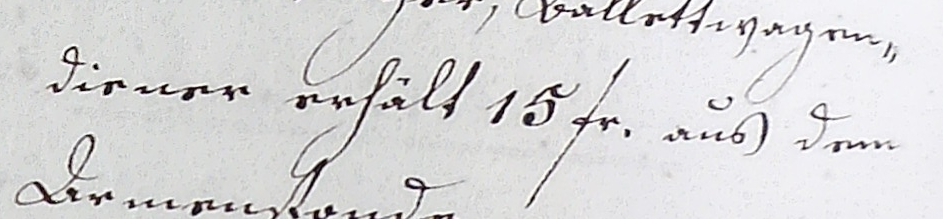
diener erhält 15 fr. aus dem
